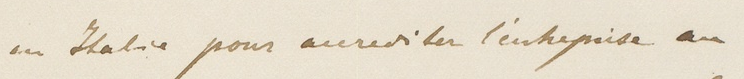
en Italie pour accrediter l'entreprise au
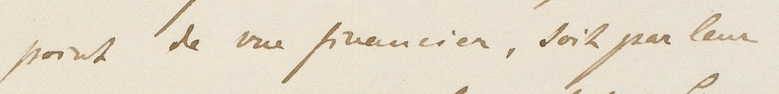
point de vue financier, soit par leur
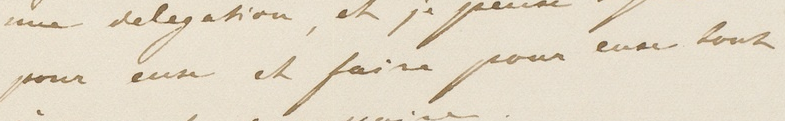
pour eux et faire pour eux tout
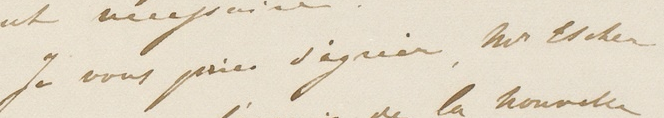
Je vous prie d'agréer, Mr Escher
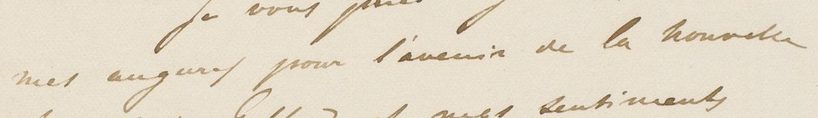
mes augures pour l'avenir de la nouvelle
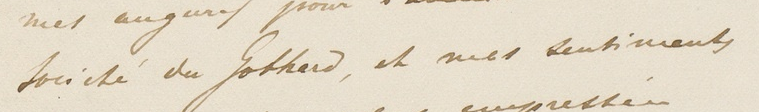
Societé du Gothard, et mes sentiments
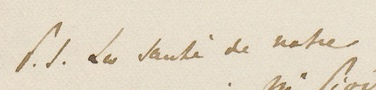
P. S. La santè de notre
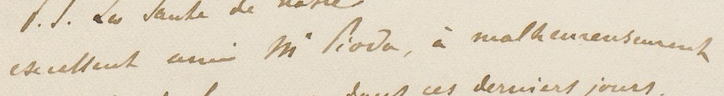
excellent ami MrPioda, à malheureusement
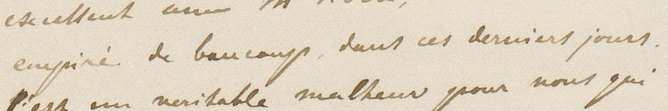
empiré de baucoup, dans ces derniers jours.
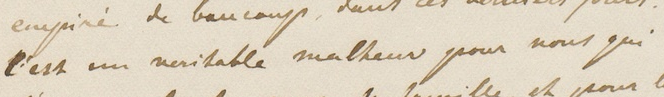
C'est un veritable malheur pour nous qui
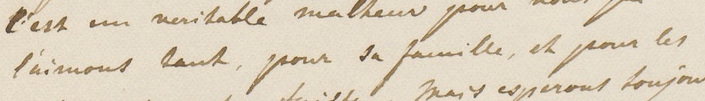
l'aimons tant, pour sa famille, et pour les
